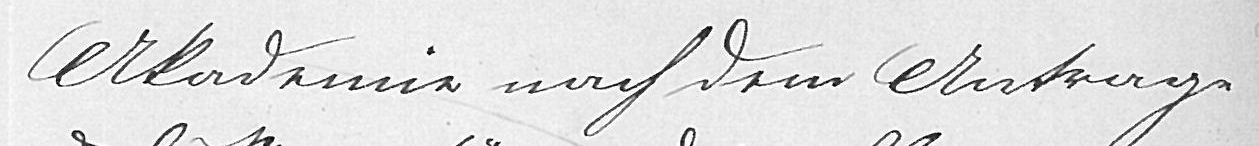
Akademie nach dem Antrage
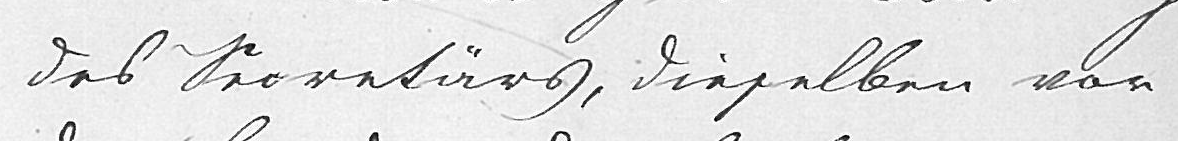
des Secretärs, dieselben vor
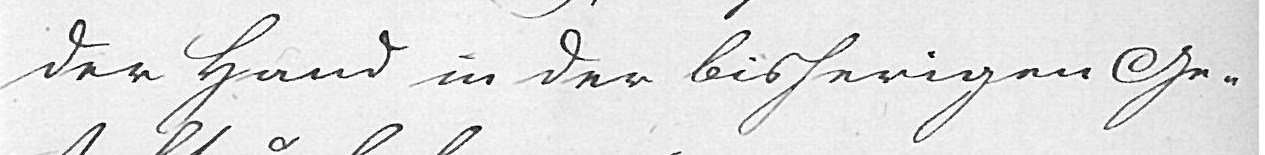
der Hand in der bisherigen Ge-
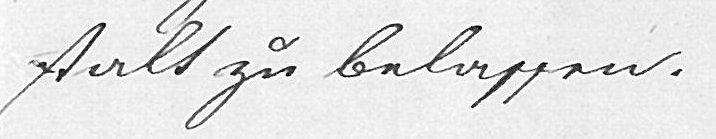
stalt zu belassen.
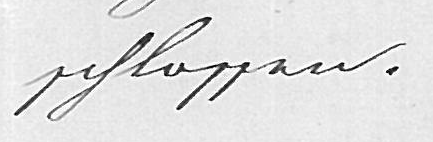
schlossen.
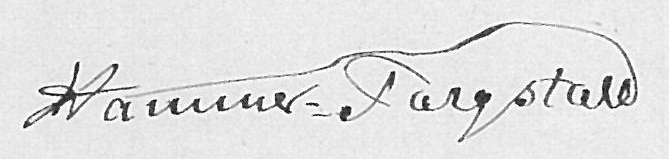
Hammer-Purgstall
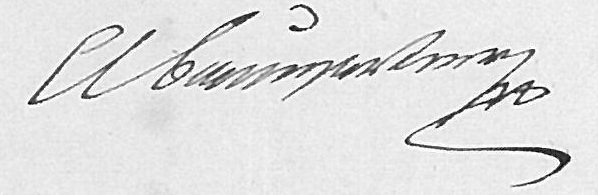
ABaumgartner
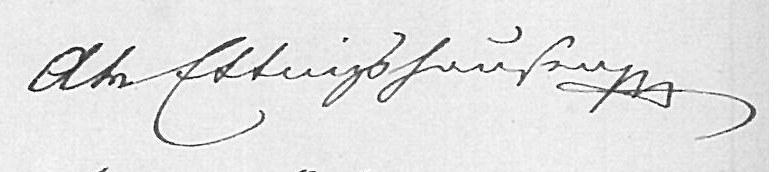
AvEttingshausen
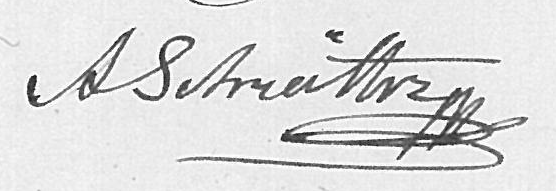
ASchrötter
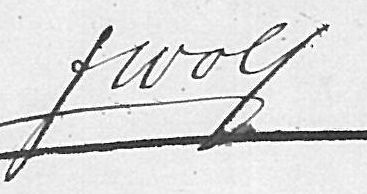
FWolf
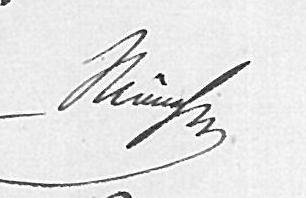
Münch
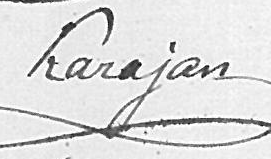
Karajan
